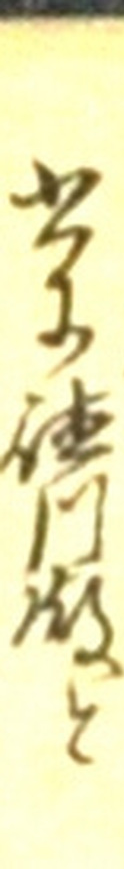書に徳川殿と
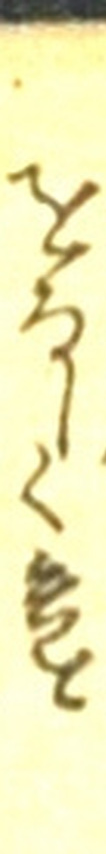をなしく兵を
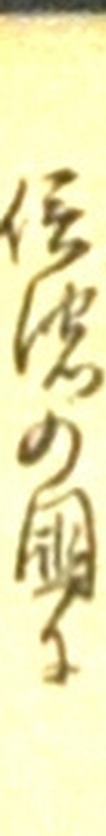信濃の国に
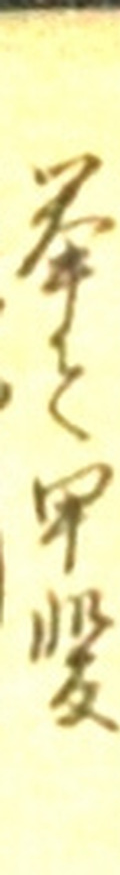挙て甲斐
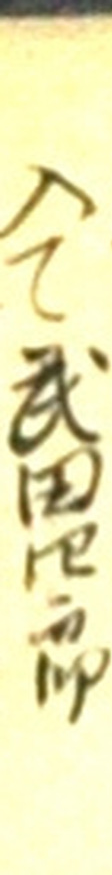入て武田四郎
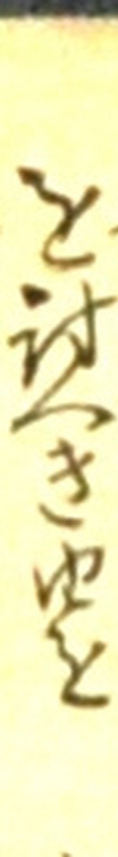を討へき由を
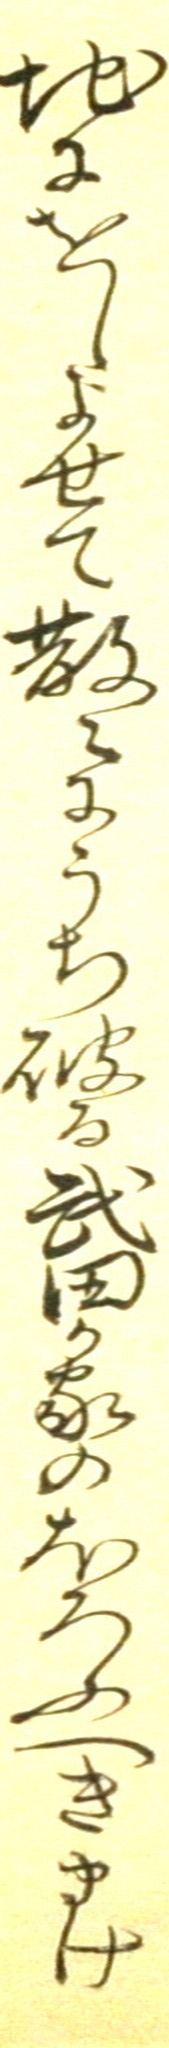地にをしよせて散々にうち破る武田か家のほろふへきまけ
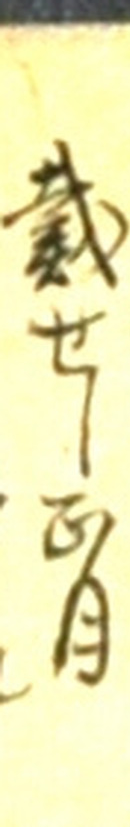載せし正月
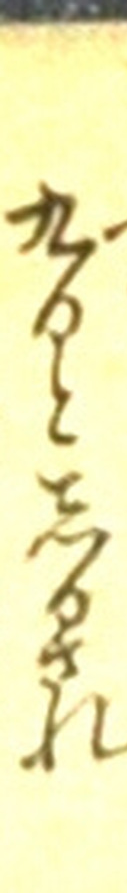九日としるされ
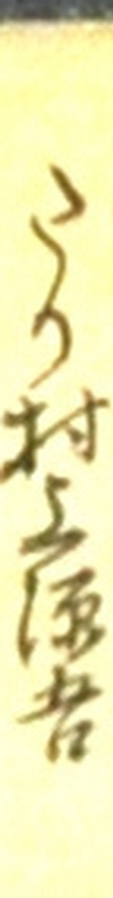たり村上源吾
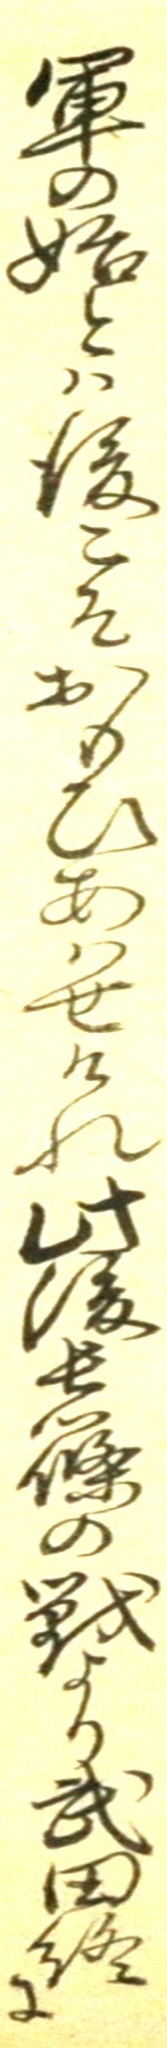軍の始とは後こそおもひあはせけれ此後長篠の戦より武田終に
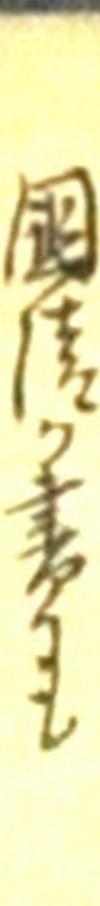国清か書にも
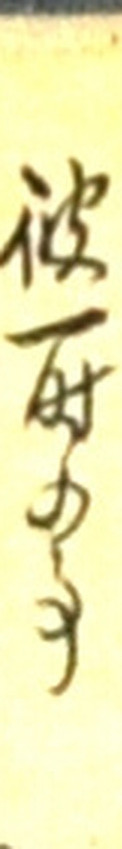彼一時の事
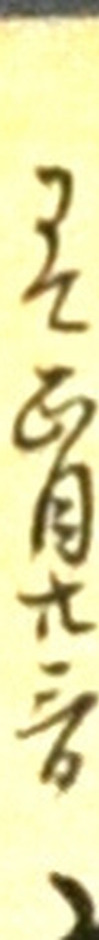にて正月廿三日
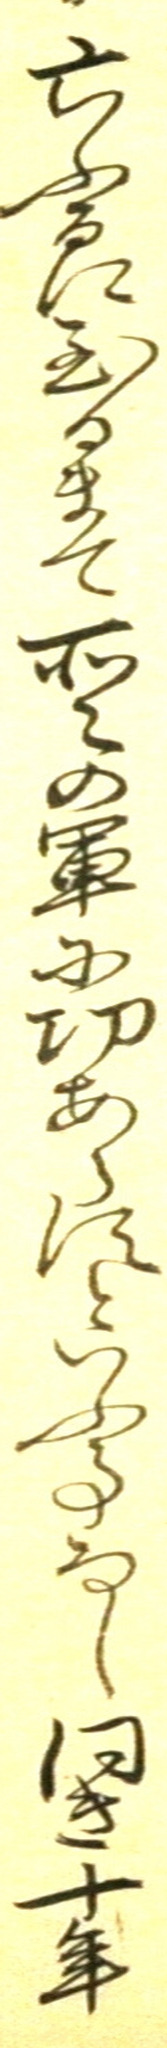亡ふるに至るまて所々の軍に功あらすといふ事なし同き十年
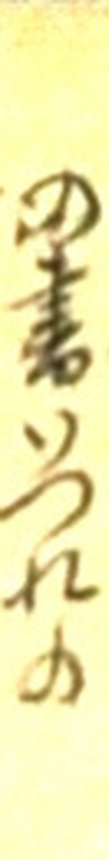の書いつれの
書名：藩翰譜（四・上）
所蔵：伊那市立高遠町図書館・合同会社AMANE
